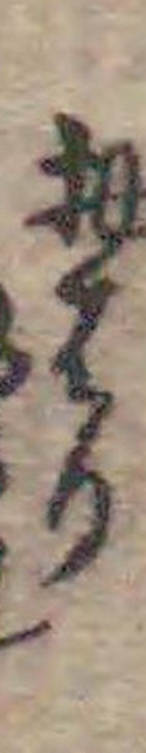おはり
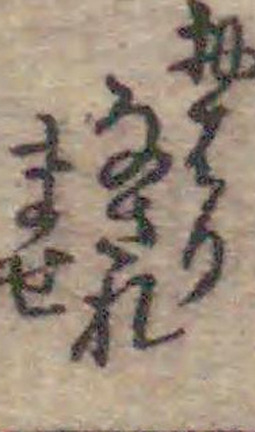なされ

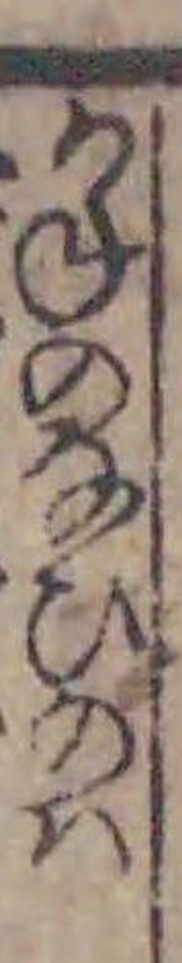かねのなひのは
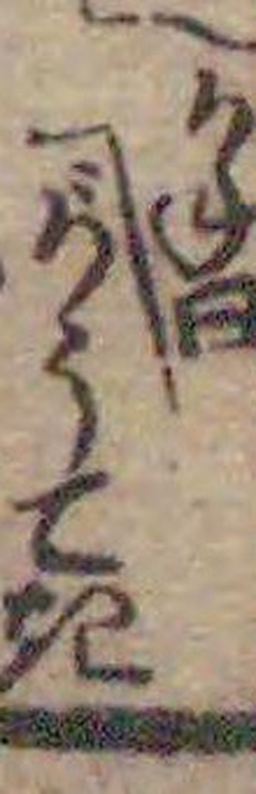〽がうてき
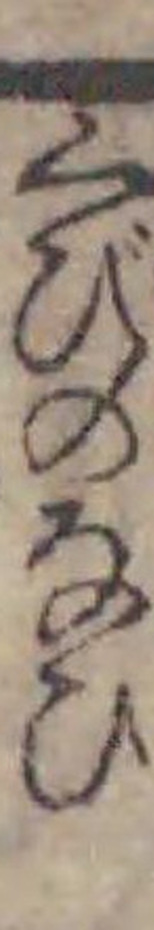くびのなひ
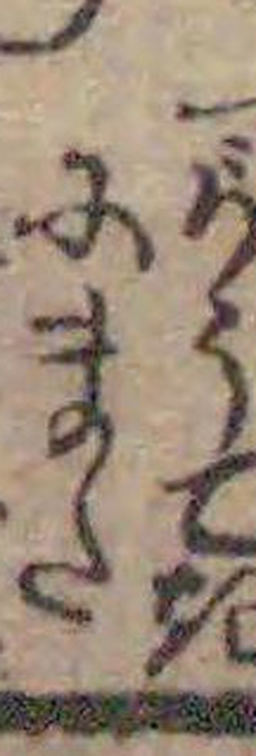にまた
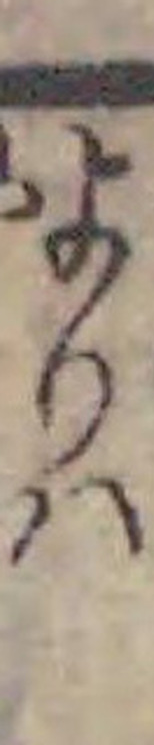よりは
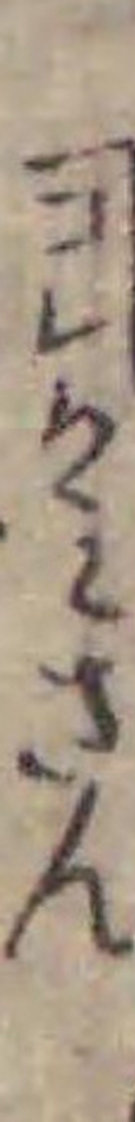〽コレかみさん
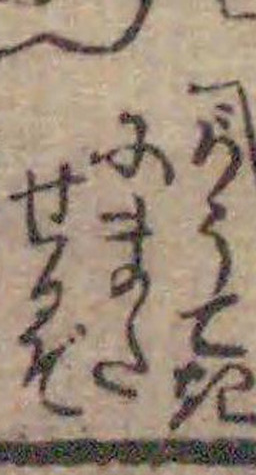にまた
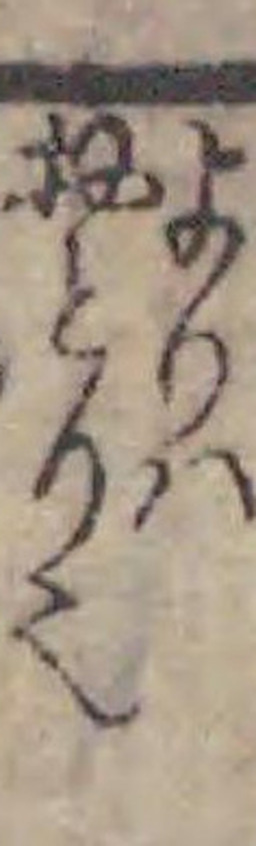おとり也
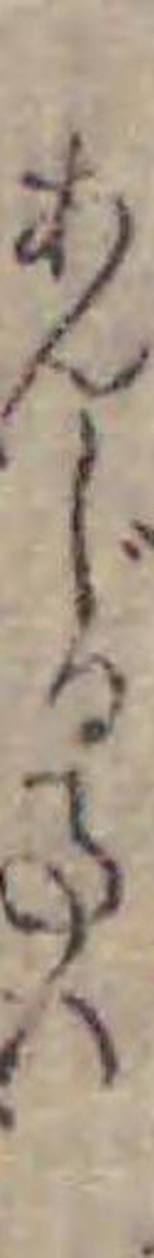あんじる事は
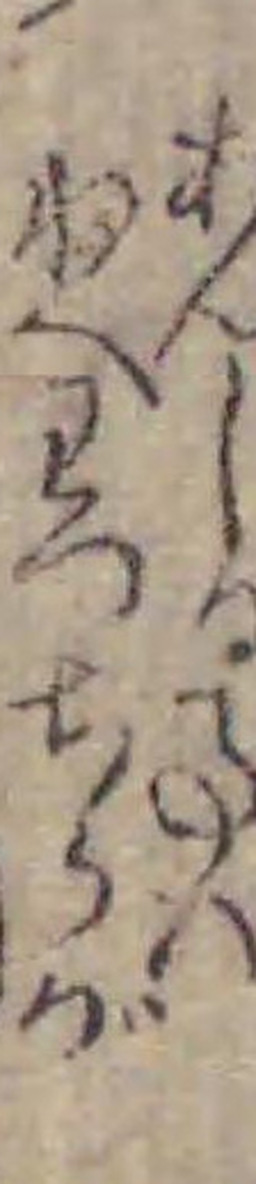ねへわつちらが
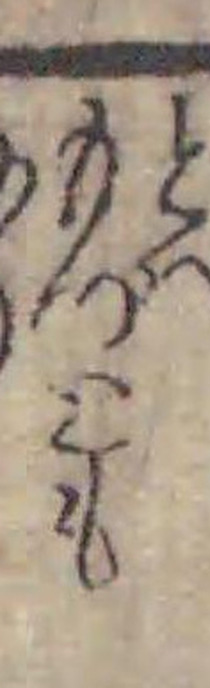もつとも
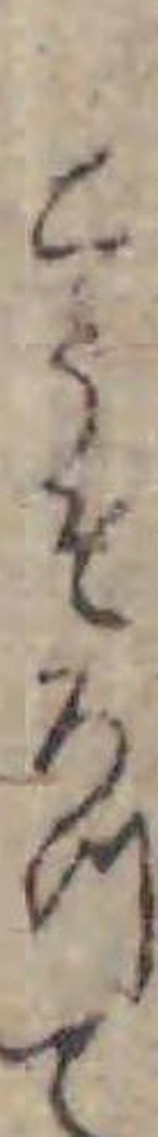こうそろつて
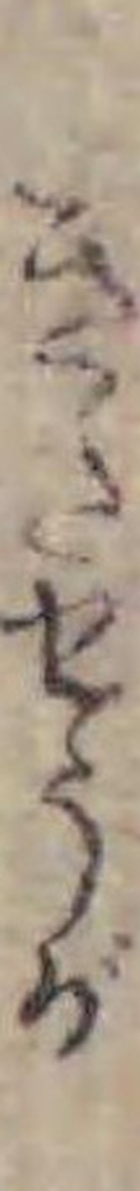きたせうが
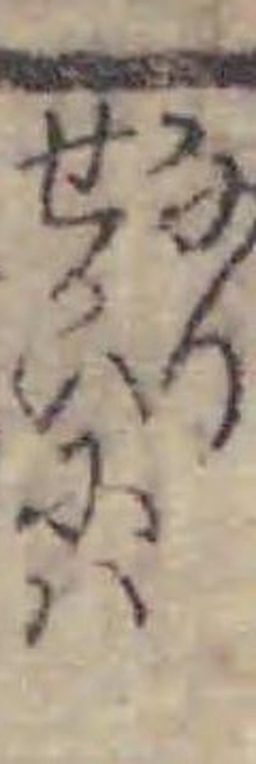せかいには
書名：新鋳小判 : 3巻
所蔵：国立国会図書館 National Diet Library, JAPAN
